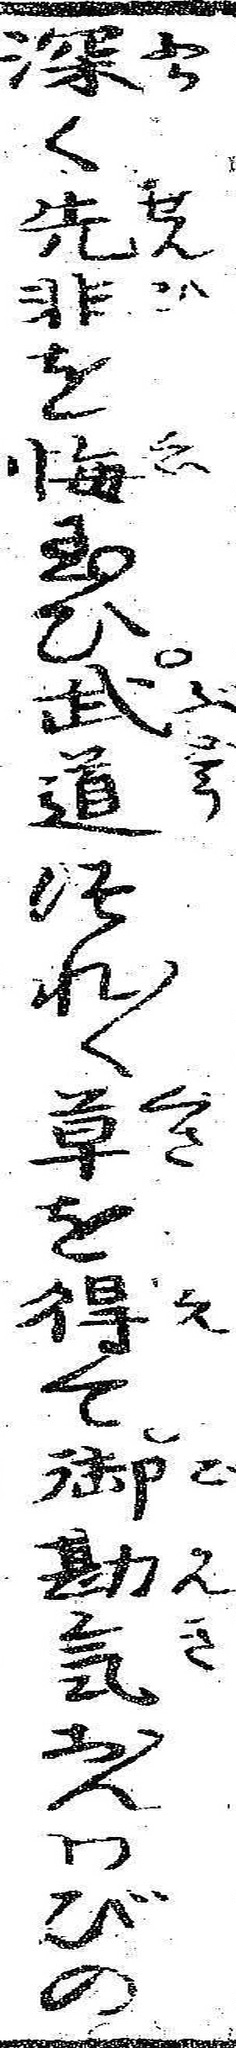深く先非を悔玉ひ。武道つれ〳〵草を得て。御勘気おんわびの
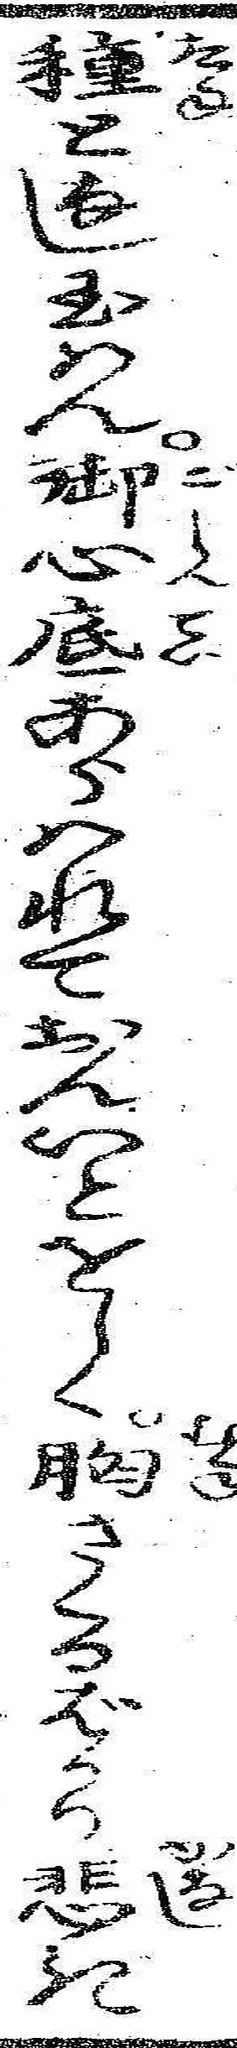種となし玉はん。御心底あらはれておんいとをしく。胸さくるばかり悲き
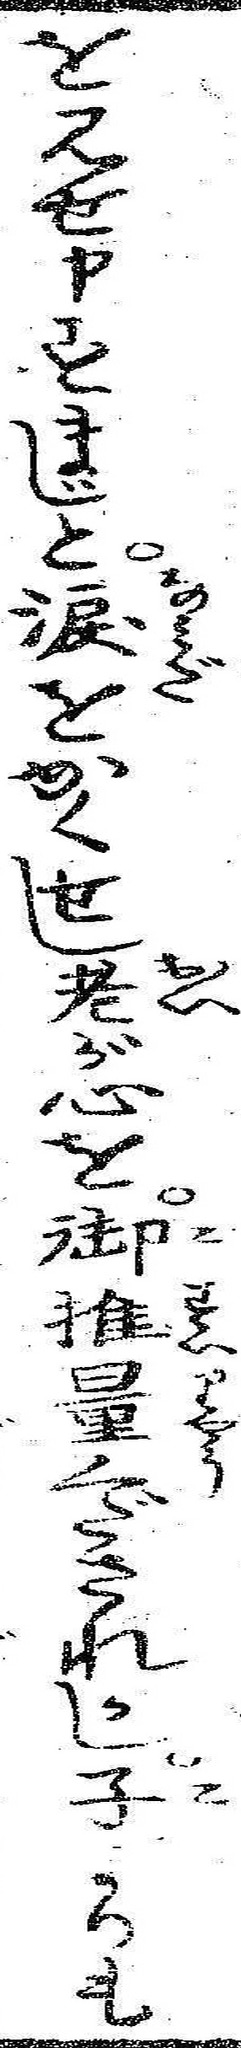を見せ申すまじと。涙をかくせし老が心を。御推量くだされかし。子よりも
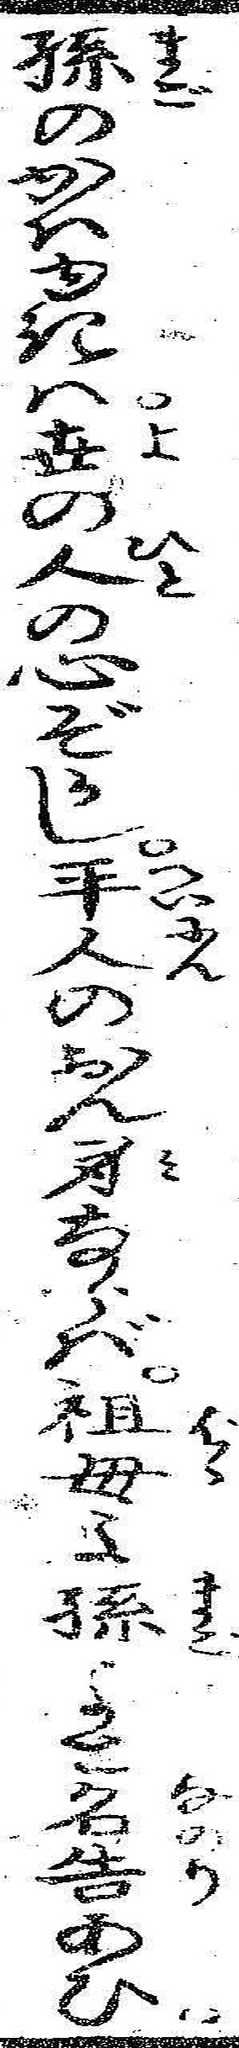孫のかはゆきは。世の人の心ぞかし。平人のおん身ならば。祖母よ孫よと名告あひ。
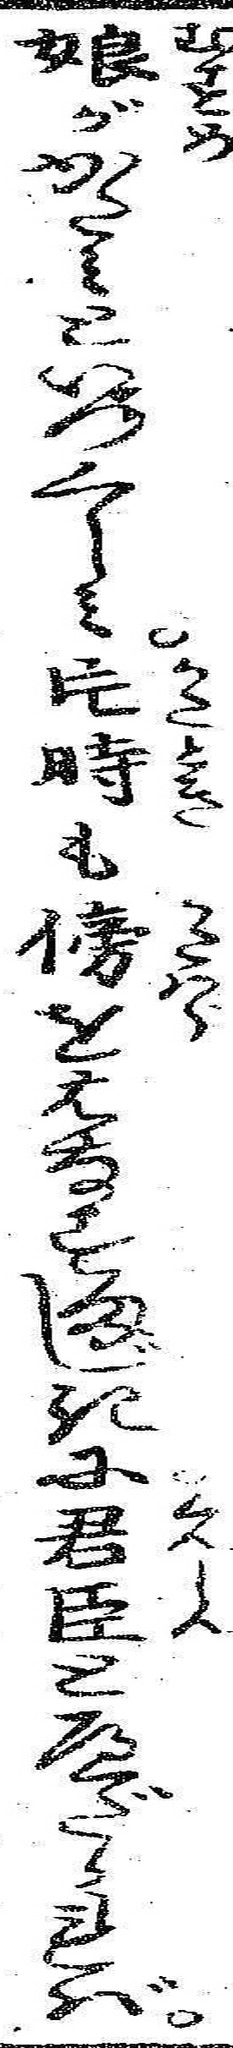娘がかたみといつくしみ。片時も傍をはなすまじきに。君臣とへだゝれば。
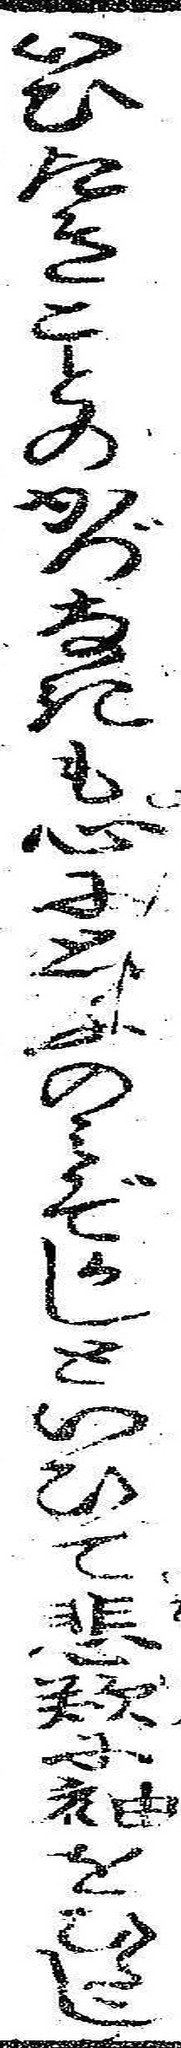いひたきことのかづなきも。心に思ふのみぞかしといひて。悲歎に袖をひたし
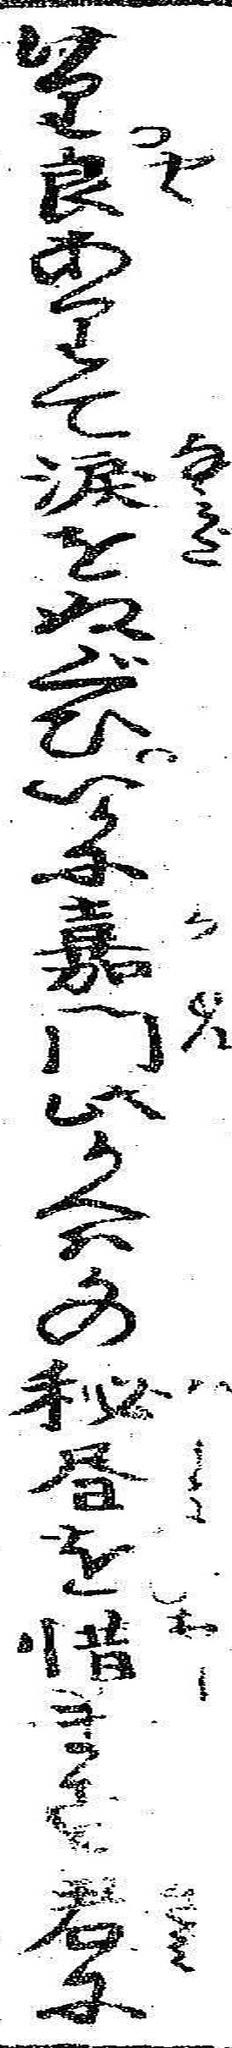けり。良ありて涙をぬぐひ。いかに嘉門此うへはかの秘書を惜ます君に
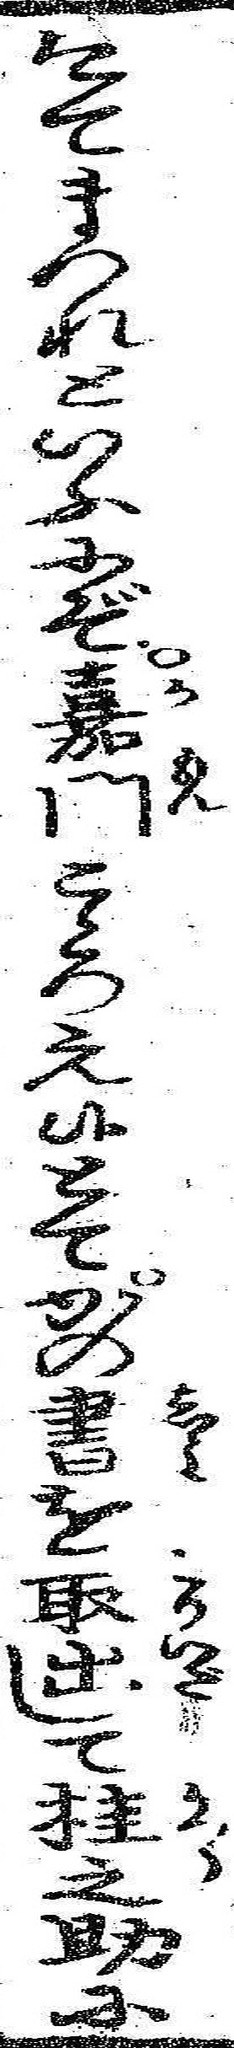たてまつれといふにぞ。嘉門こゝろえ候とて。かの書を取出して桂之助に
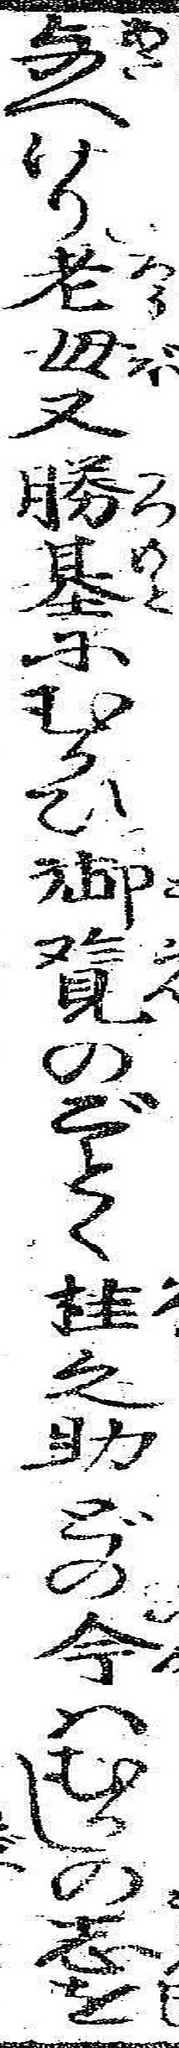与へけり。老母又勝基にむかひ。御覧のごとく桂之助どの。今はむかしの志を
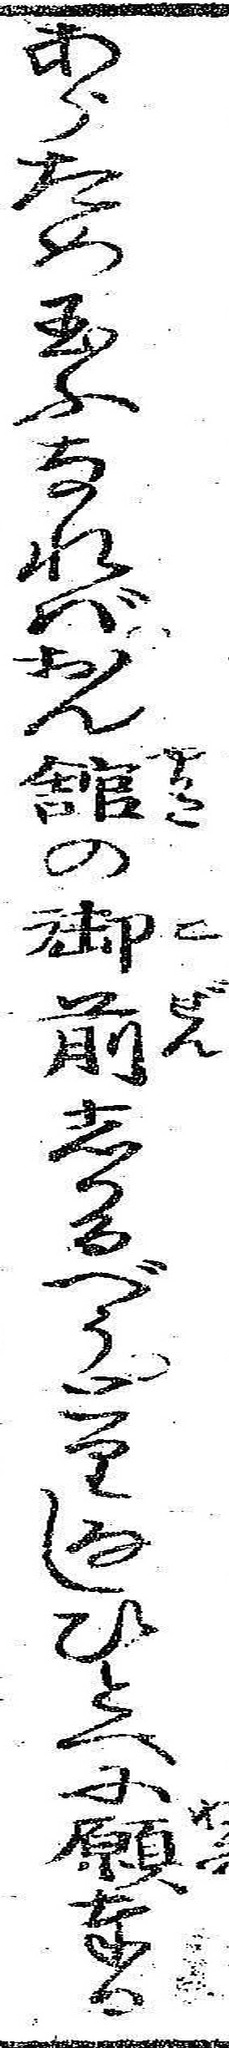あらため玉ふなれば。おん館の御前しかるべう。とりなしひとへに願奉る
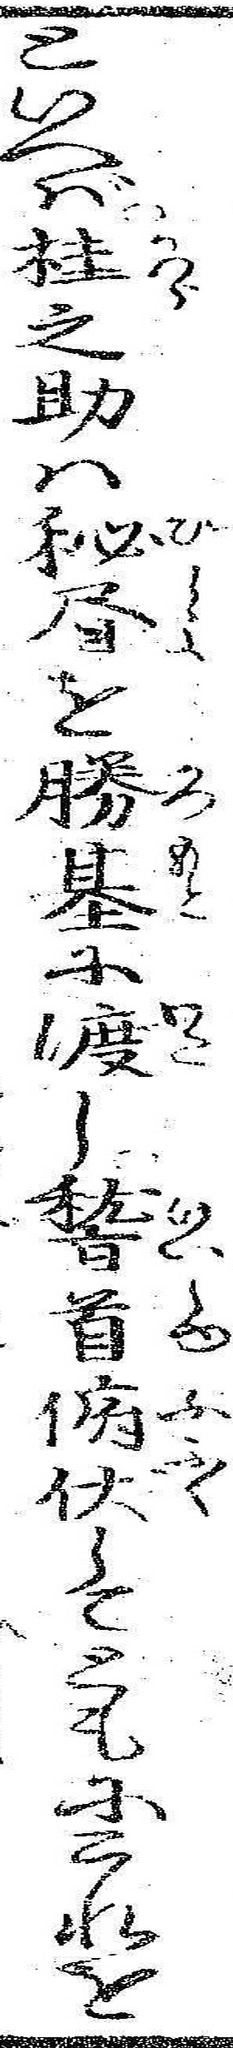といへば。桂之助は秘書を勝基に渡し。稽首俯伏してともにこれを
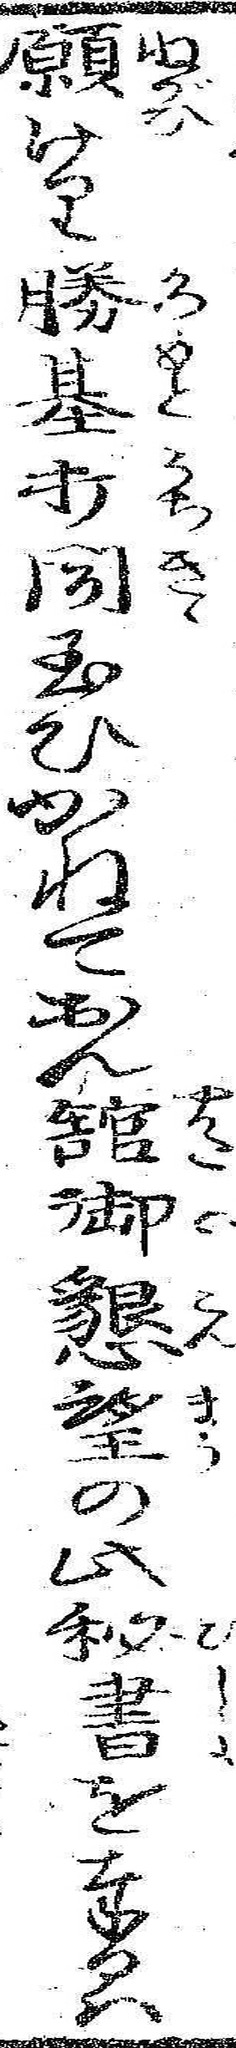願けり勝基打聞玉ひかねておん館御懇望の此秘書を奉るは
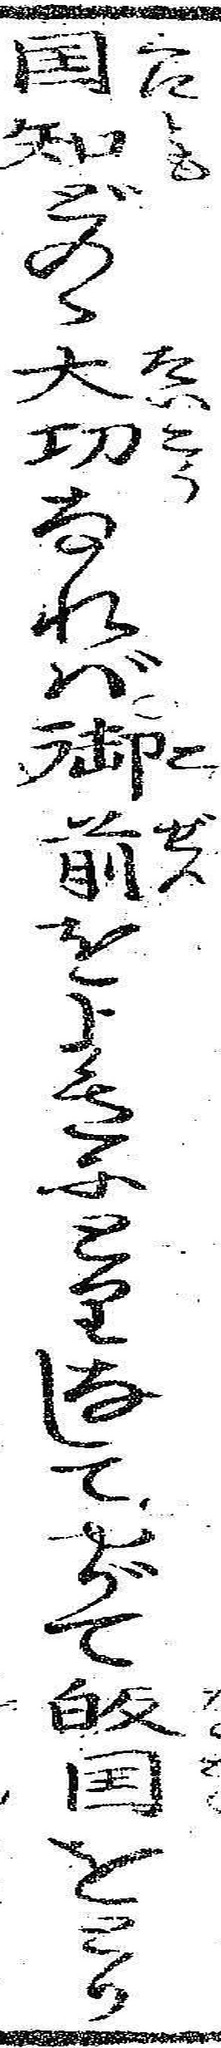国知どのゝ大㓛なれば。御前をよきにとりなして。やがて帰国をとり
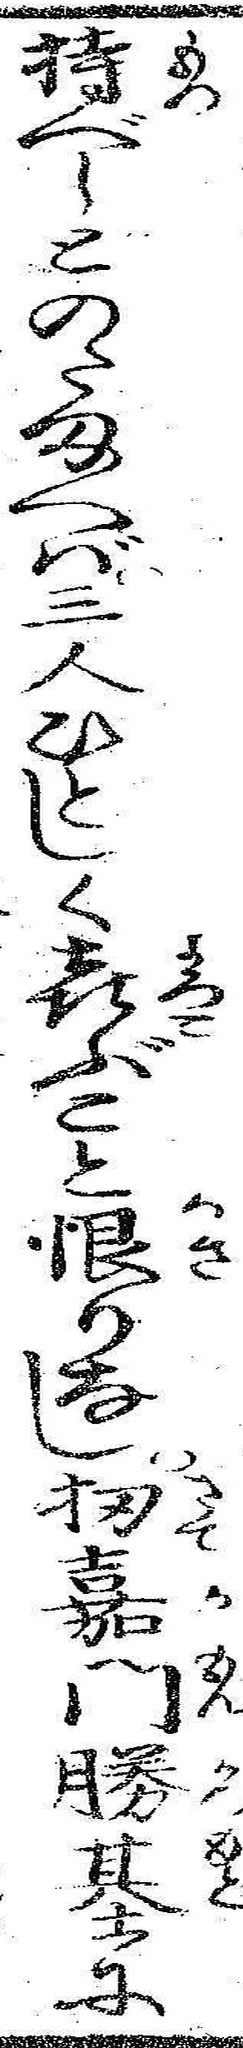持べしとのたまへば。三人ひとしく喜ぶこと恨りなし。扨嘉門勝基に
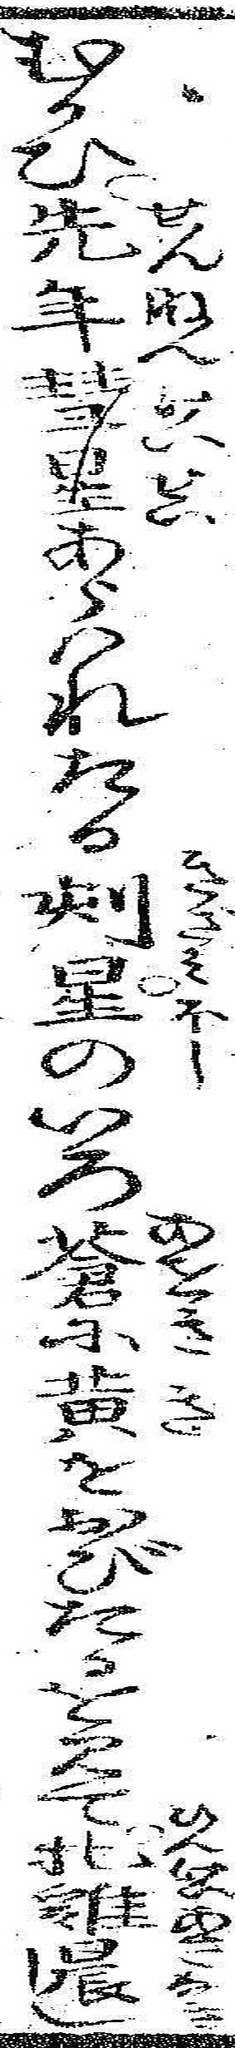むかひ。先年彗星あらはれたる刻。星のいろ蒼に黄をおびたるを見て。牝鷄晨し
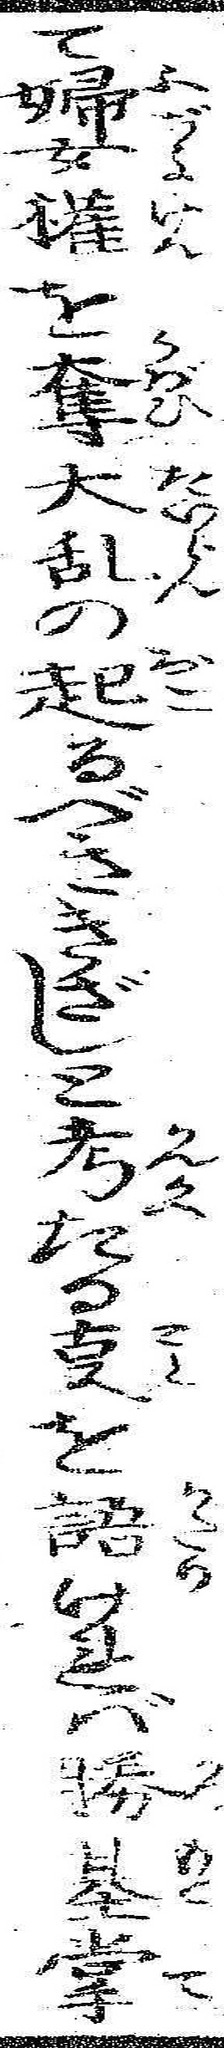て婦女権を奪。大乱の起るべききざしと考たる事を語ければ。勝基掌
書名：昔話稲妻表紙
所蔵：国文学研究資料館
